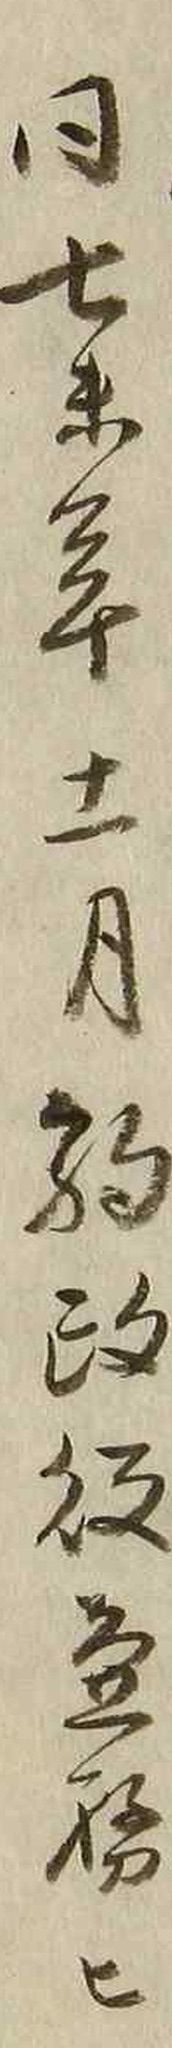一同七未年十一月駒改役兼務被
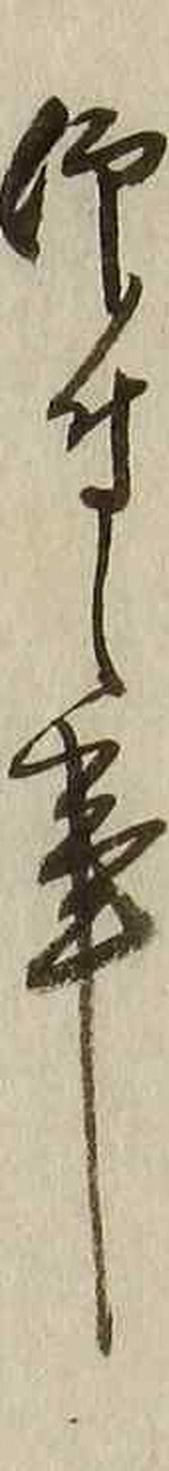仰付候事
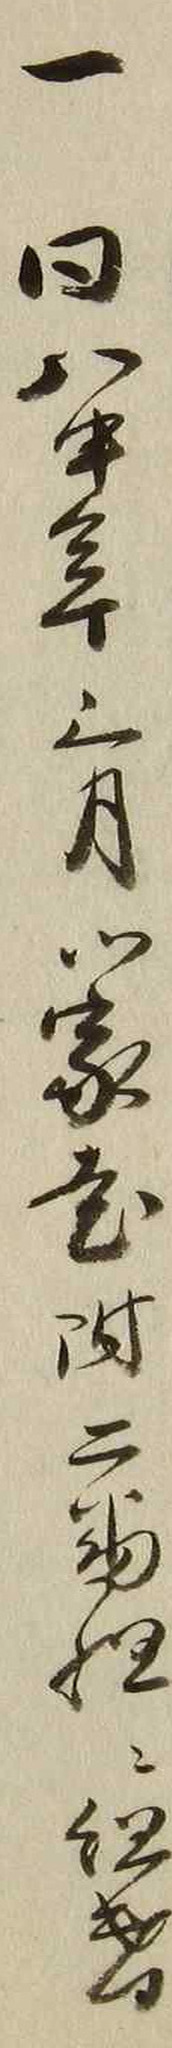一同八申年三月御家老附二番組ニ組替
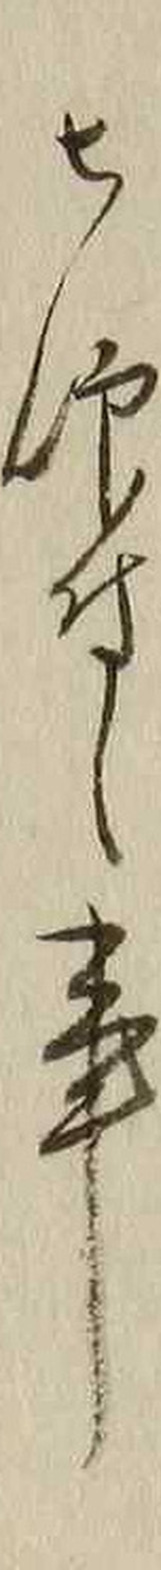被仰付候事
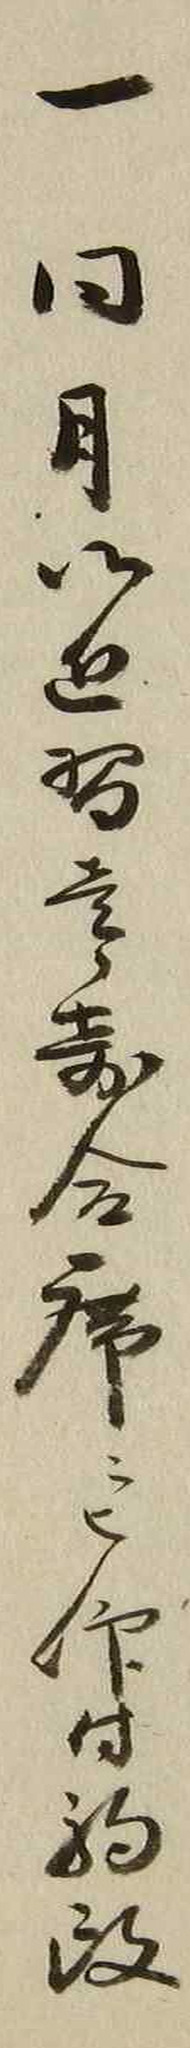一同月御近習壱ノ寄合席ニ被仰付駒改
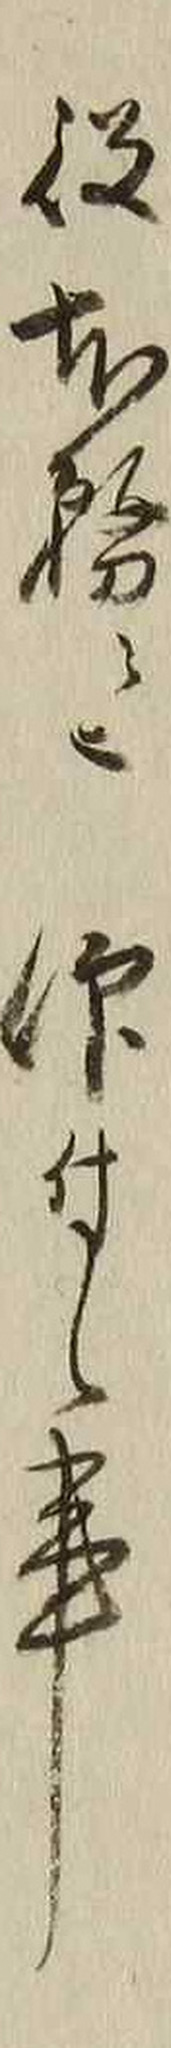役本務ニ被仰付候事
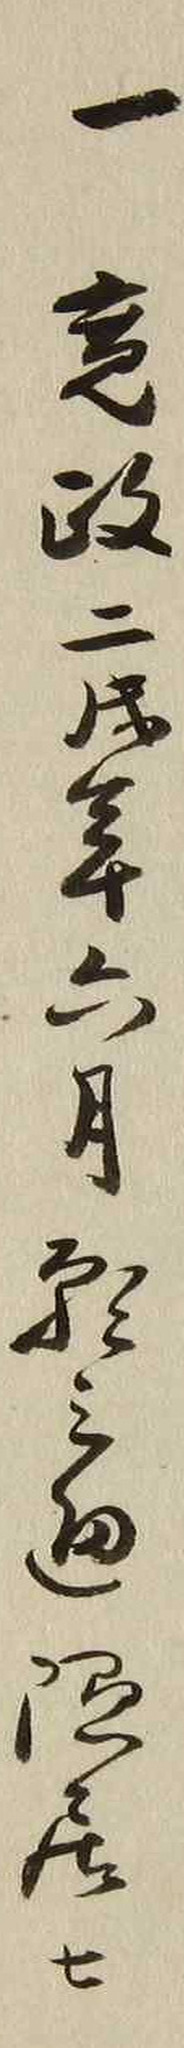一寛政二戌年六月願之通隠居被
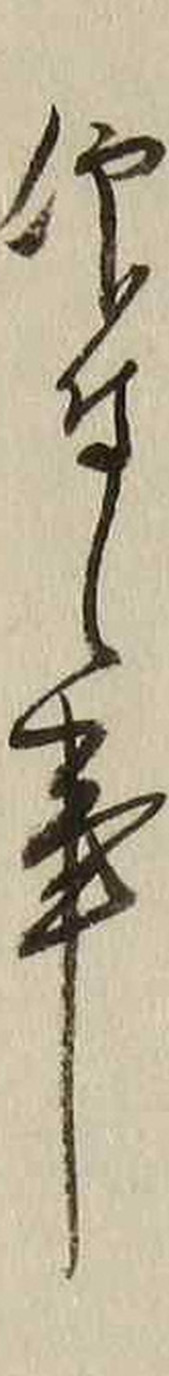仰付候事
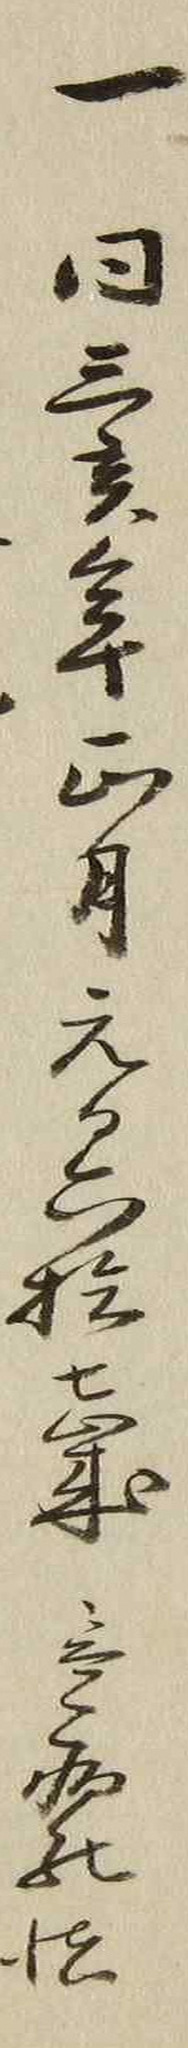一同三亥年正月元日六拾七歳ニ而病死法
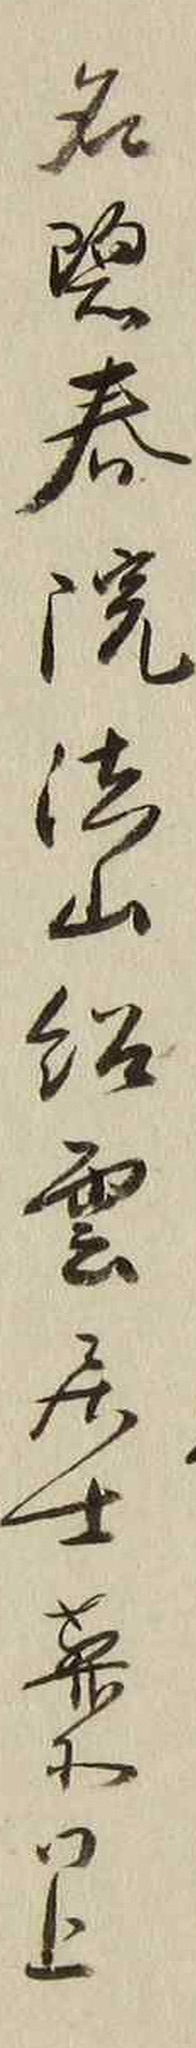名碧春院法山紹雲居士葬所同上
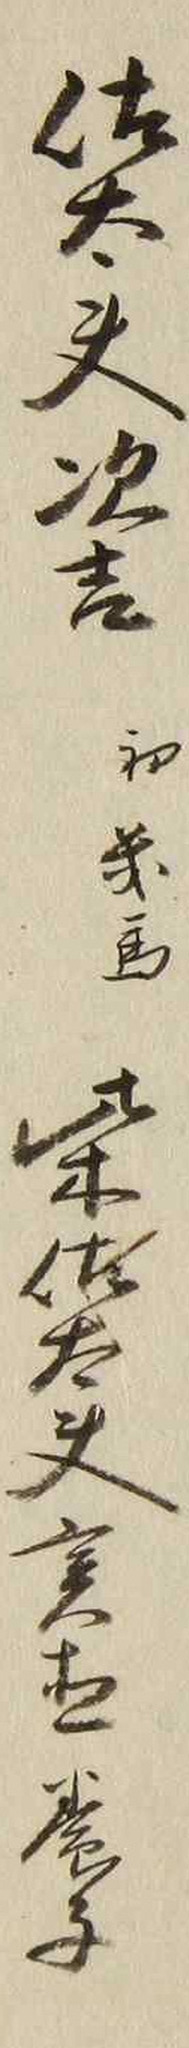佐太夫次吉初畿馬柴佐太夫実直養子
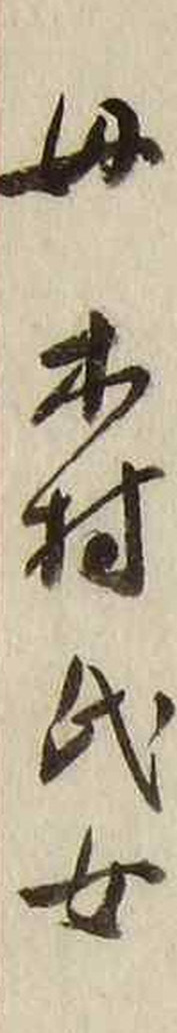母木村氏女

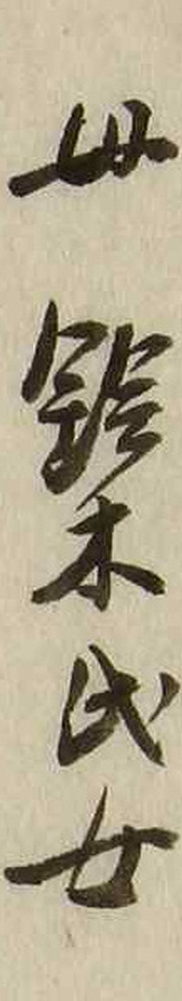母鈴木氏女
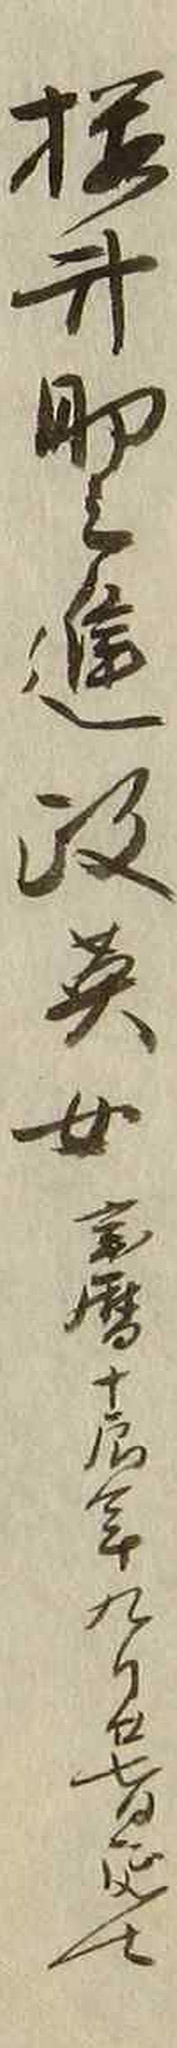桜井助之進政英女宝暦十辰年九月廿七日誕生
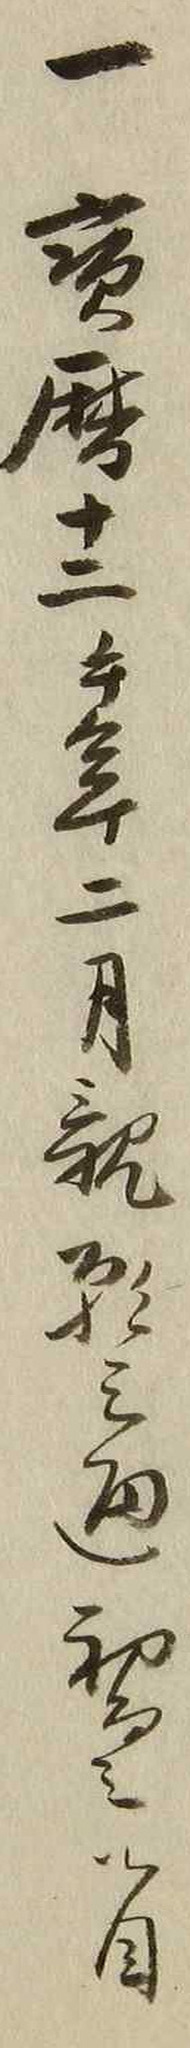一宝暦十二午年二月親願之通初而之御目
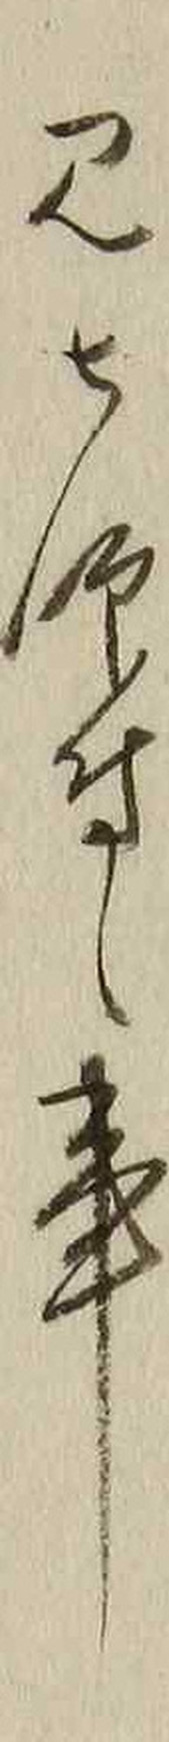見被仰付候事
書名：諸士系譜　巻之311　し之部1
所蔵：会津若松市立会津図書館
